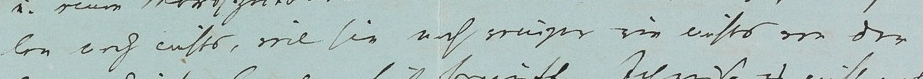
len noch nichts, weil sie noch weniger wie nichts von der
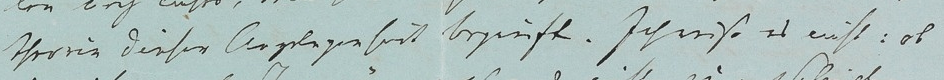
Theorie dieser Angelegenheit begreift. Ich weiß es nicht: ob
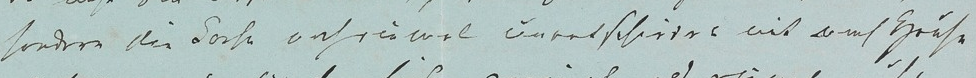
sondern die Sache noch einmal unentschieden mit nach Hause
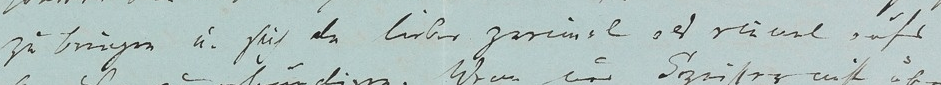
zu bringen u. sich da lieber zweimal als einmal aufs
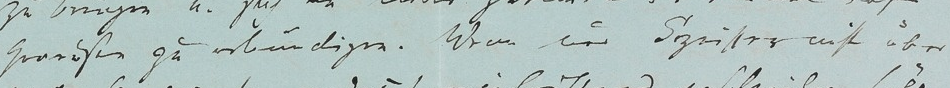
Genauste zu erkundigen. Wenn nur Speisser nicht über
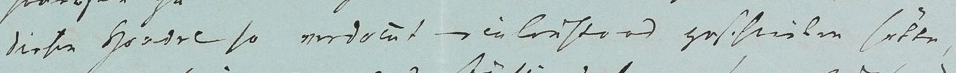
diesen Handel so verdammt einleuchtend geschrieben hätte,
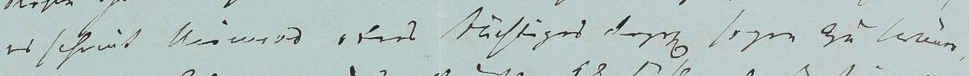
es scheint Niemand etwas tüchtiges dagegen sagen zu können,
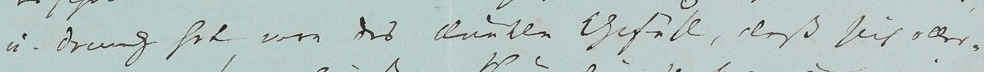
u. dennoch hat man das dunkle Gefühl, daß sich aller-
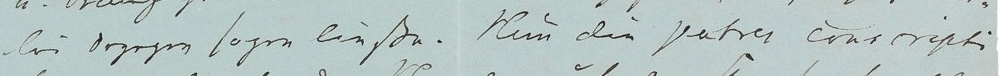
lei dagegen sagen ließe. Nun die patres conscripti
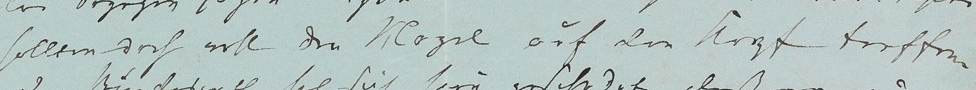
sollten doch wohl den Nagel auf den Kopf treffen.
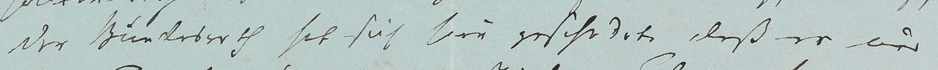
Der Bundesrath hat sich hier geschadet, daß er nur
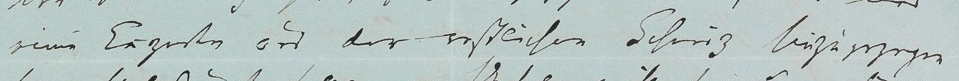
einen Experten aus der westlichen Schweiz hinzugezogen
